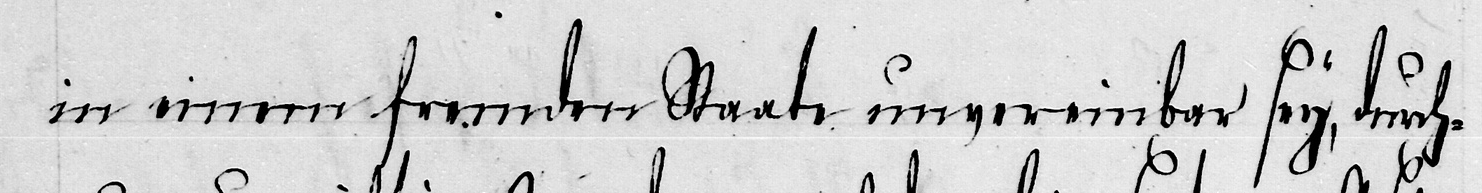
in einem fremden Staate unvereinbar sey, durch¬
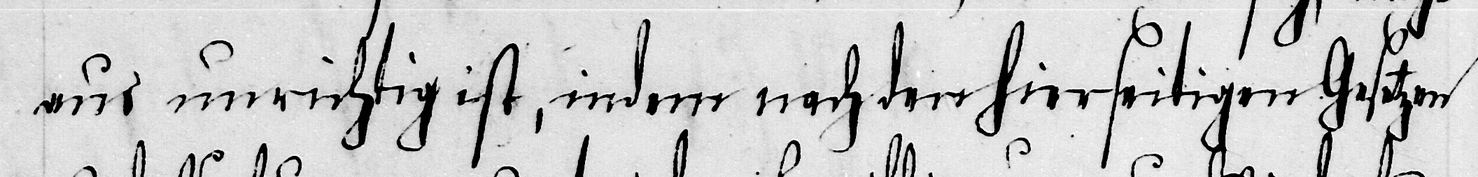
aus unrichtig ist, indem nach den hierseitigen Gesetzen
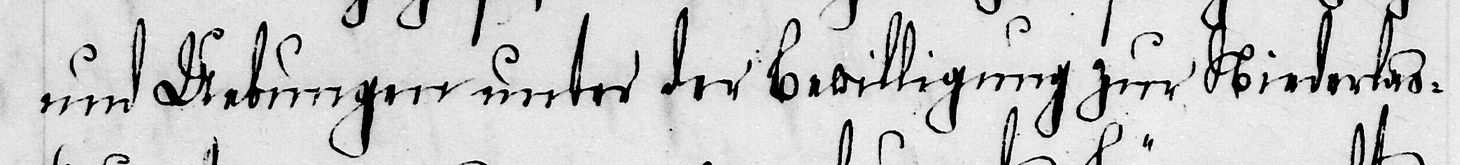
und Uebungen unter der Bewilligung zur Niederlaß¬
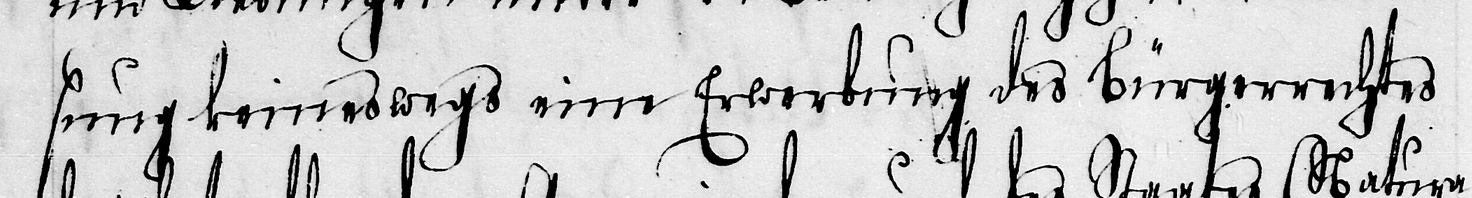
ung keineswegs eine Erwerbung des Bürgerrechtes
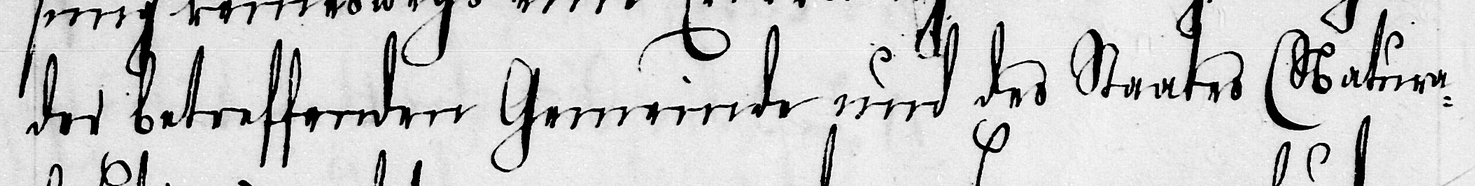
der betreffenden Gemeinde und des Staates (Natura¬
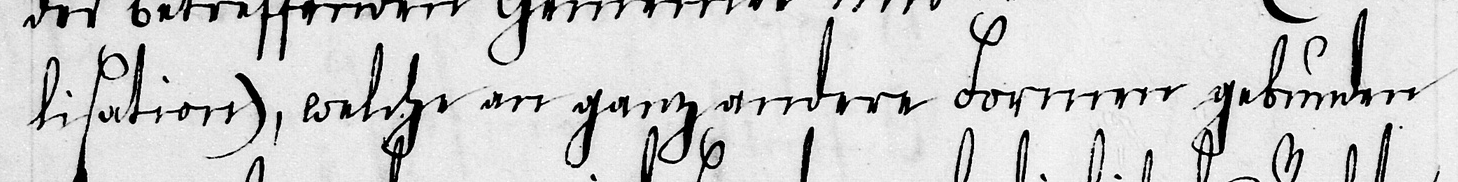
lisation), welche an ganz andere Formen gebunden
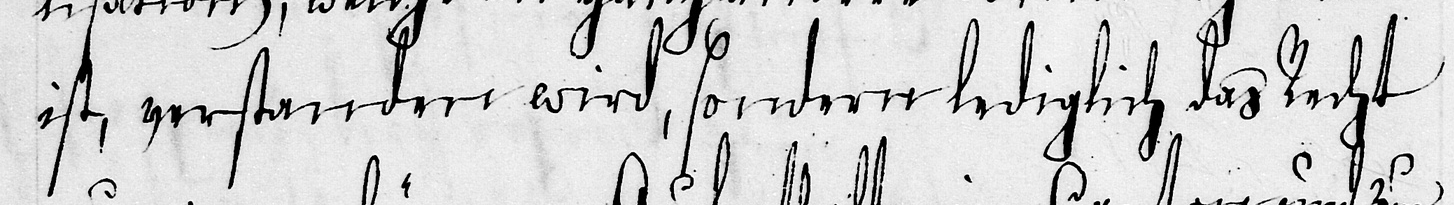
ist, verstanden wird, sondern lediglich das Recht
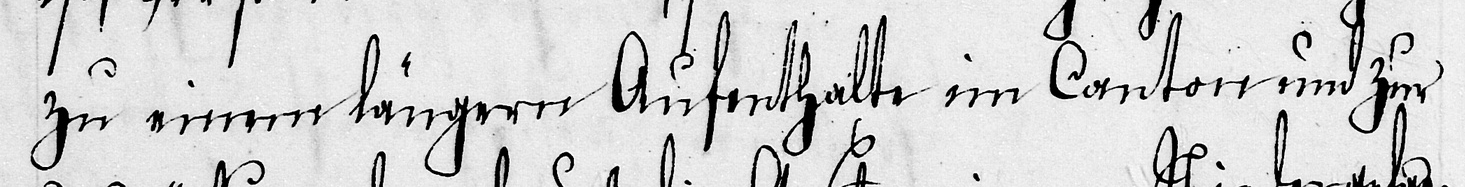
zu einem längern Aufenthalte im Canton und zur
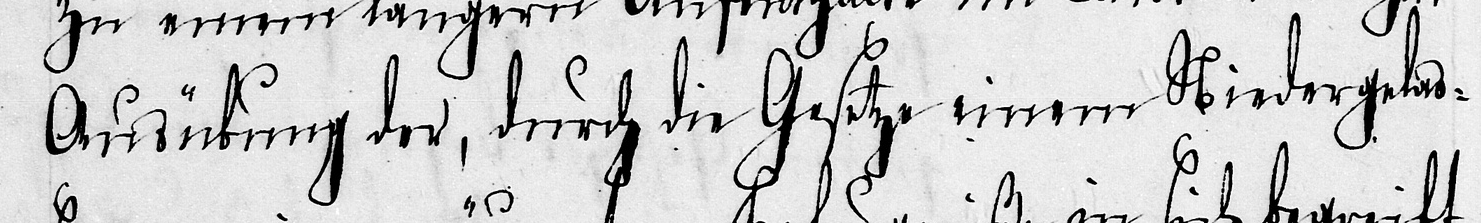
Ausübung der, durch die Gesetze einem Niedergela¬
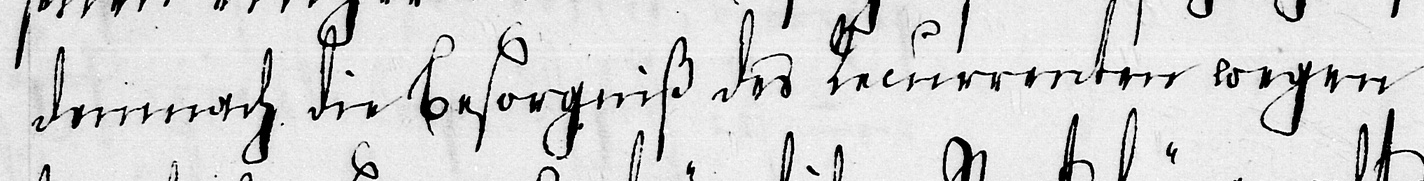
demnach die Besorgniß des Recurrenten wegen
